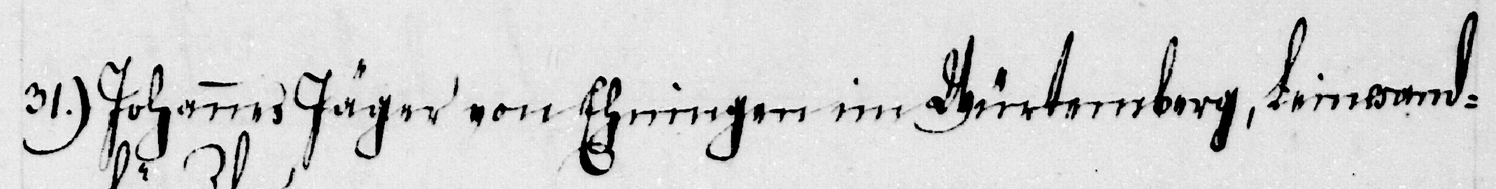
31.) Johannes Jäger von Ehningen im Würtemberg, Leinwand¬
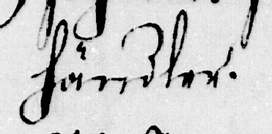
händler.
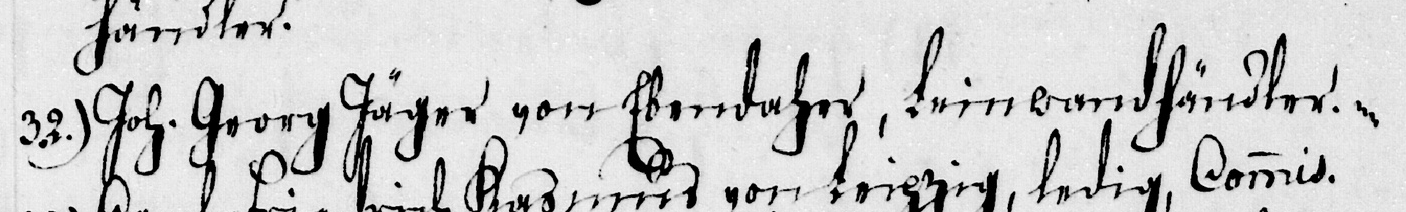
32.) Joh. Georg Jäger von Ebendaher, Leinwandhändler.
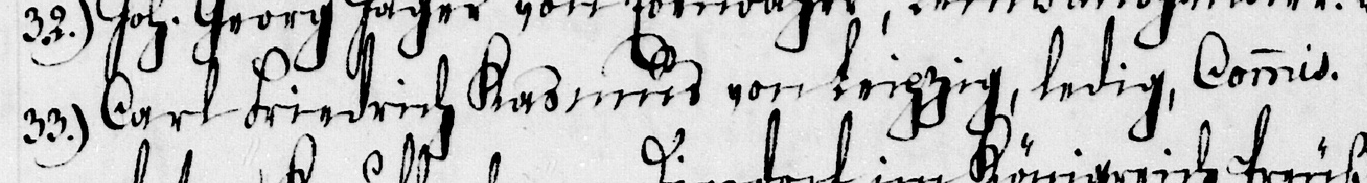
33.) Carl Friedrich Kasmus von Leipzig, ledig, Commis.
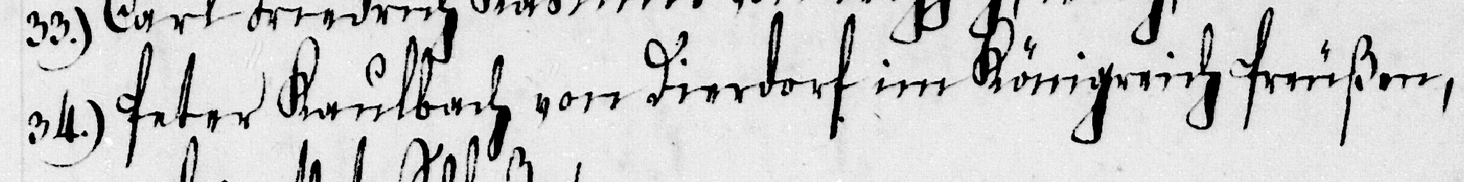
34.) Peter Kaulbach von Dierdorf im Königreich Preußen,
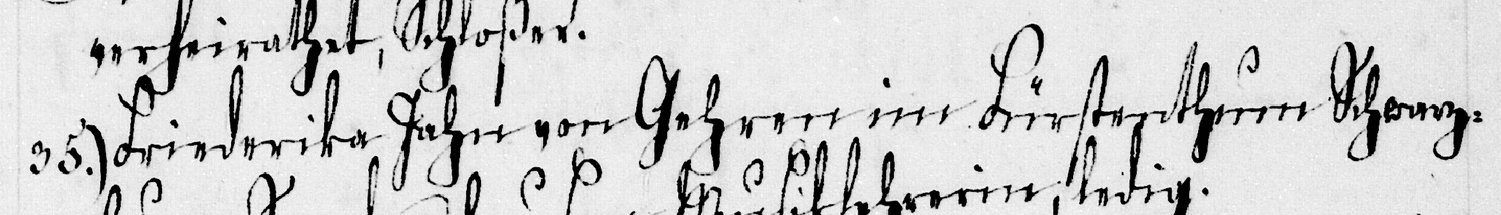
35.) Friederika Jahn von Gehren im Fürstenthum Schwarz¬
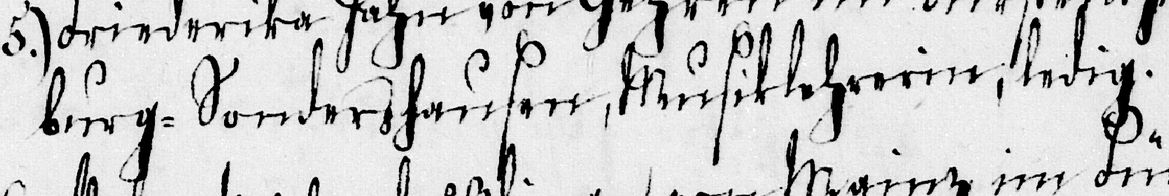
burg-Sonderhausen, Musiklehrerin, leidig.
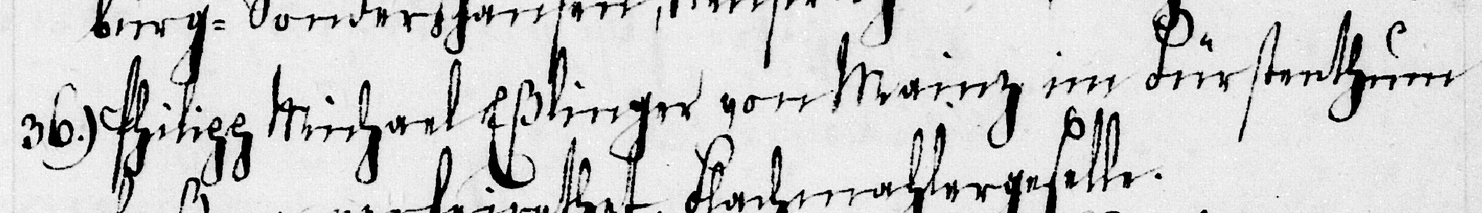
36.) Philipp Michael Eßlinger von Mainz im Fürstenthum
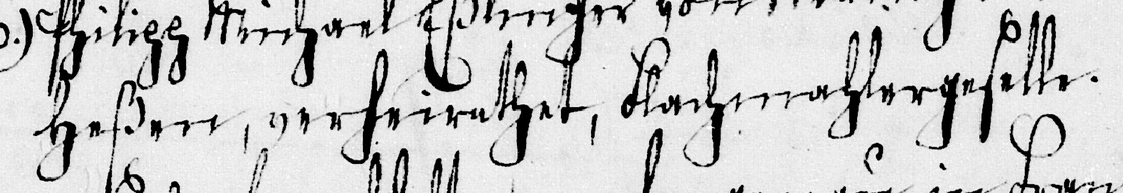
Heßen, verheirathet, Flachmahlergeselle.
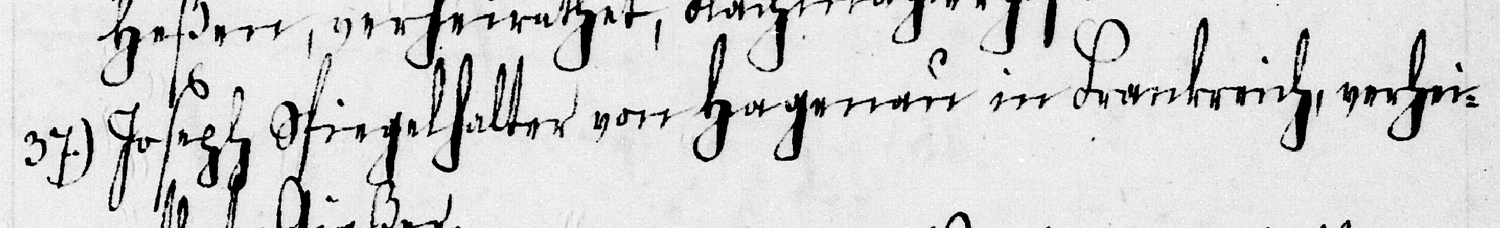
37.) Joseph Spiegelhalter von Hagenau in Frankreich, verhei¬
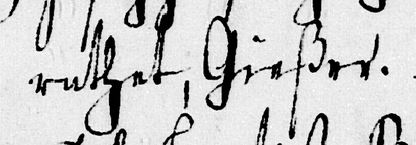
rathet, Gießer.
